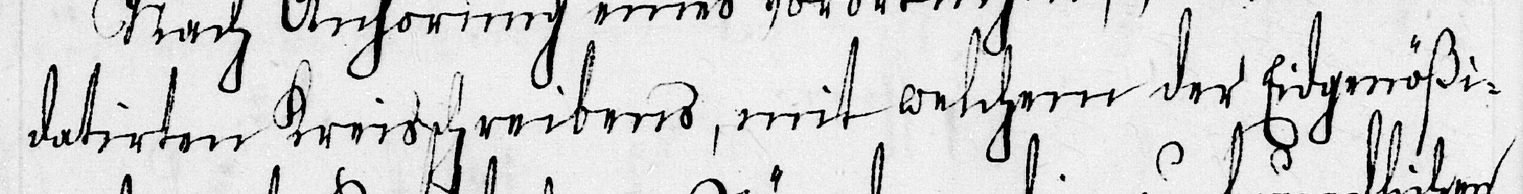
datirten Kreisschreibens, mit welchem der Eidgenößi¬
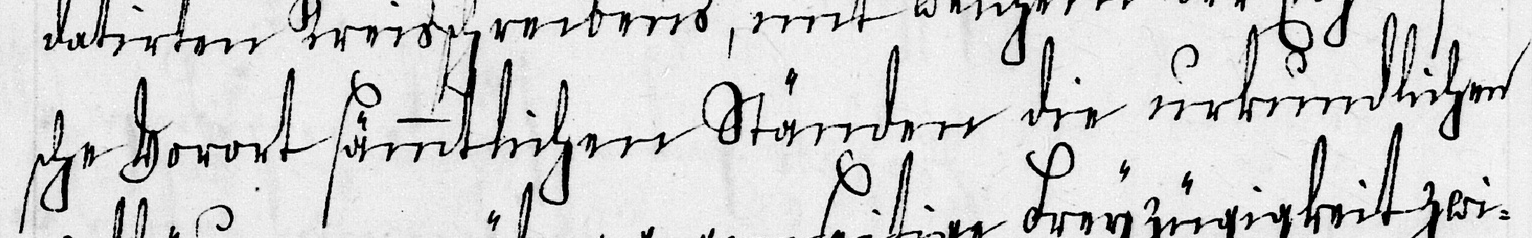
sche Vorort sämmtlichen Ständen die urkundlichen
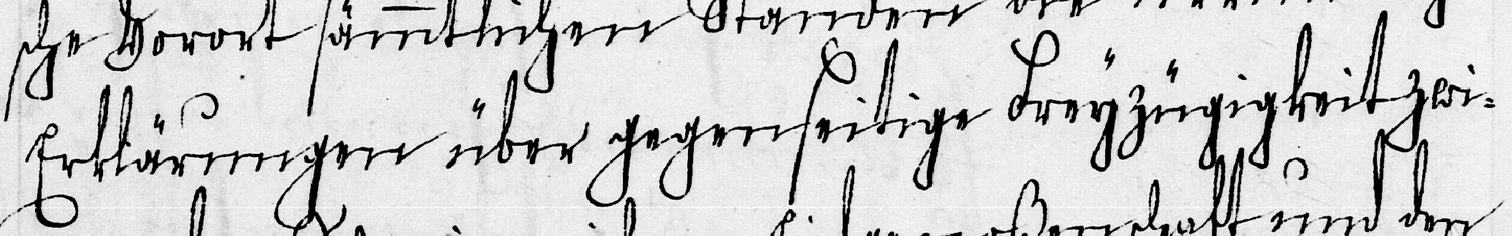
Erklärungen über gegenseitige Freyzügigkeit zwis¬
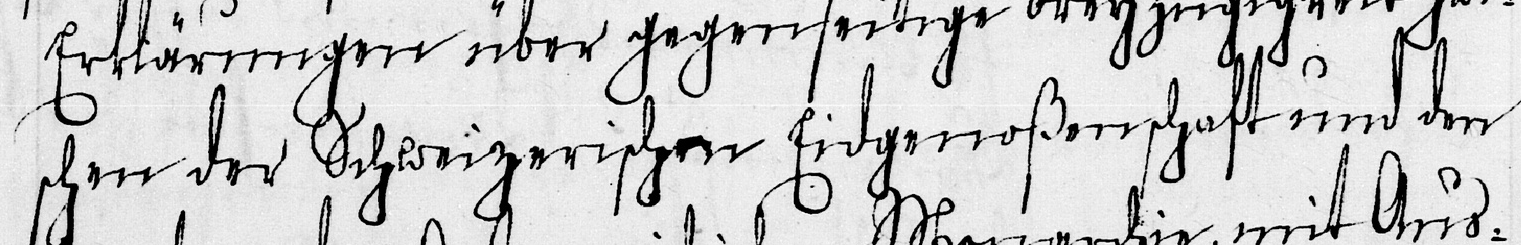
chen der Schweizerischen Eidgenoßenschaft und den
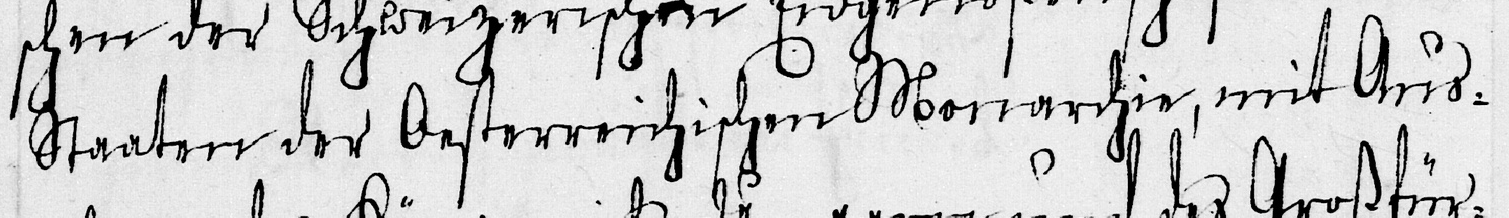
Staaten der Oesterreichischen Monarchie, mit Aus¬
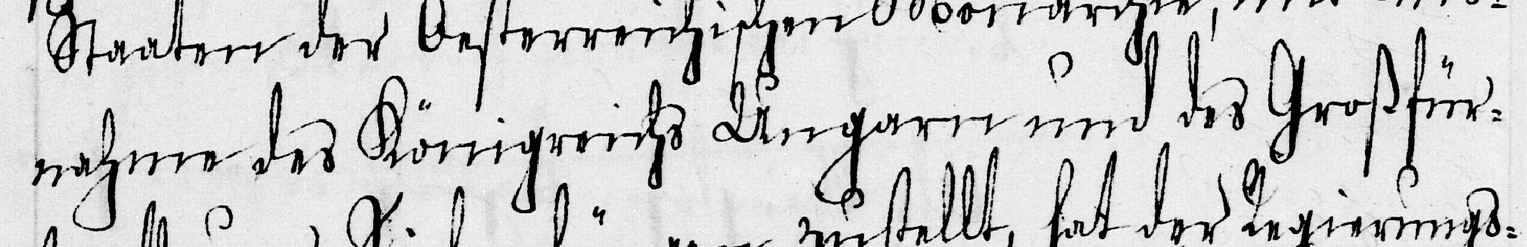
nahme des Königreichs Ungarn und des Großfür¬
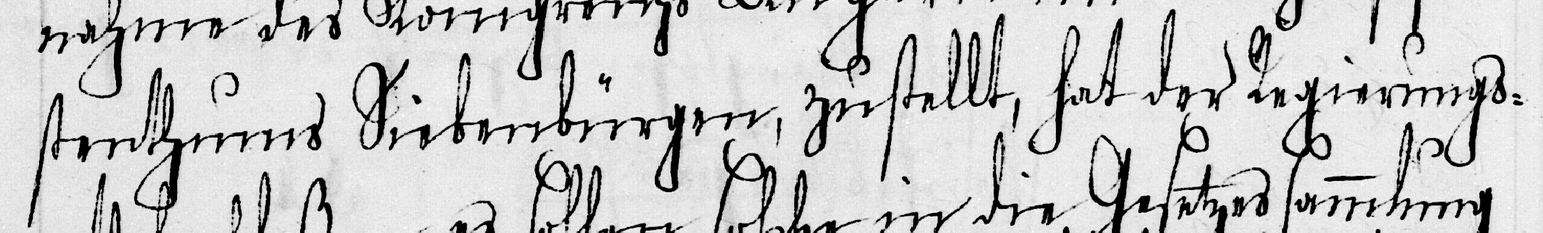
stenthums Siebenbürgen, zustellt, hat der Regierungs¬
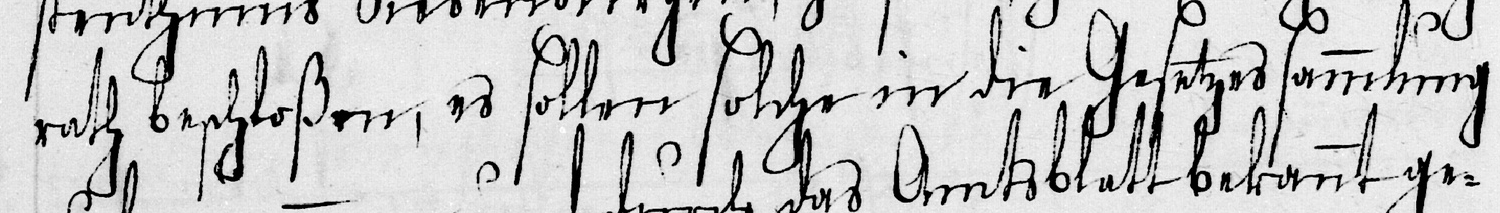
rath beschloßen, es sollen solche in die Gesetzessammlung
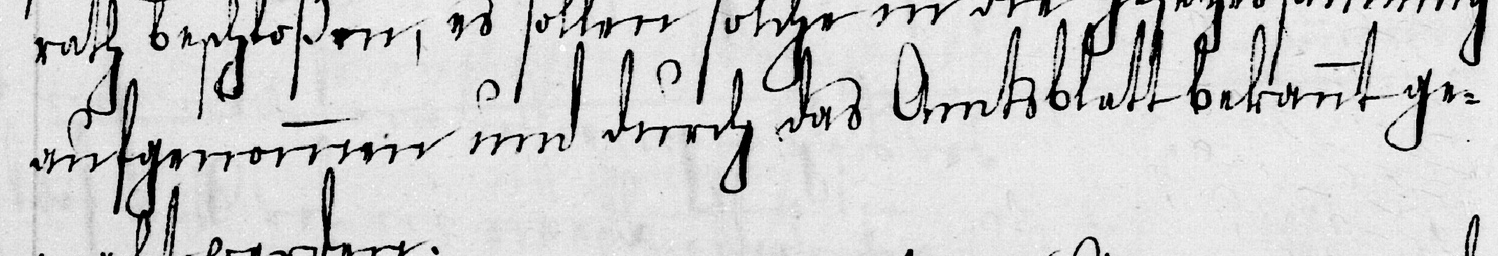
aufgenommen und durch das Amtsblatt bekannt ge¬
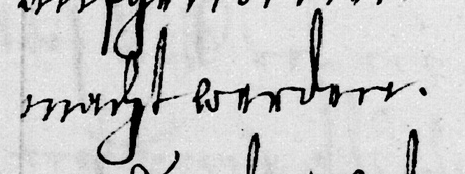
macht werden.
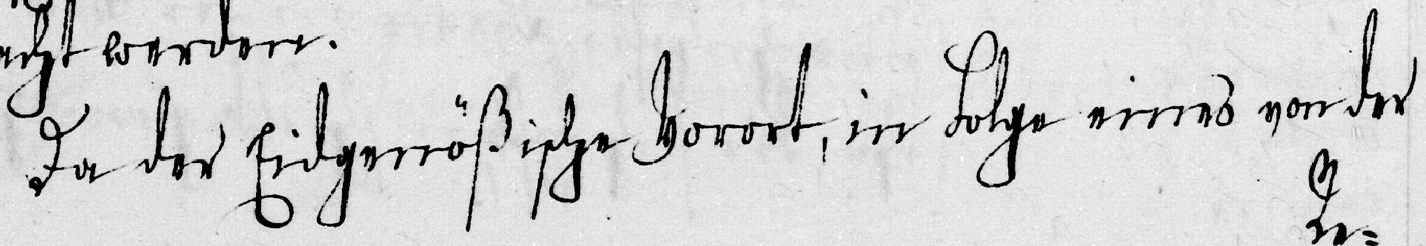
Da der Eidgenößische Vorort, in Folge eines von der
